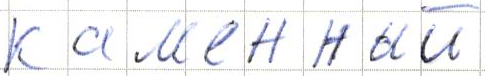каменный
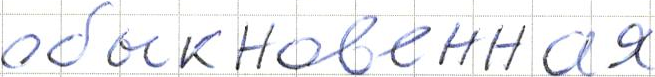обыкновенная
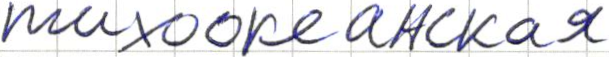тихоокеанская
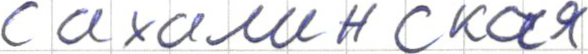сахалинская
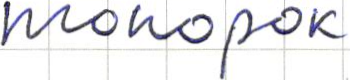топорок
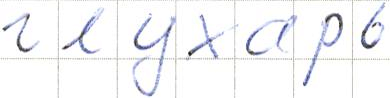глухарь
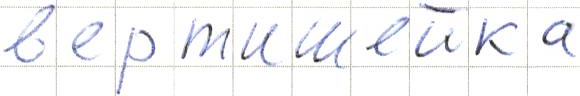вертишейка
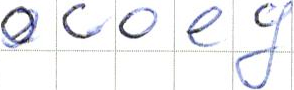осоед
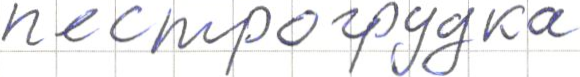пестрогрудка
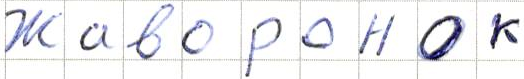жаворонок
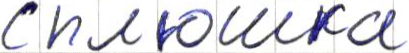сплюшка
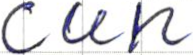сип
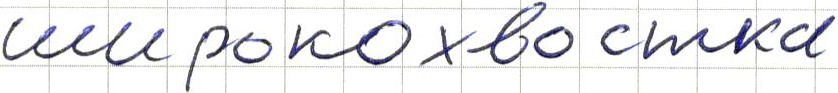широкохвостка
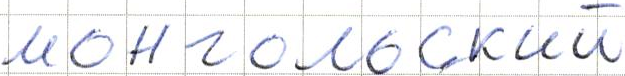монгольский
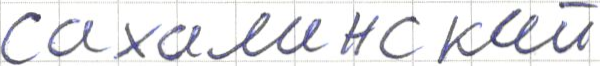сахалинский
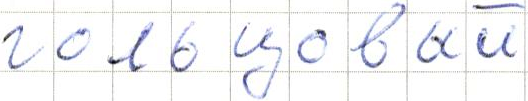гольцовый
